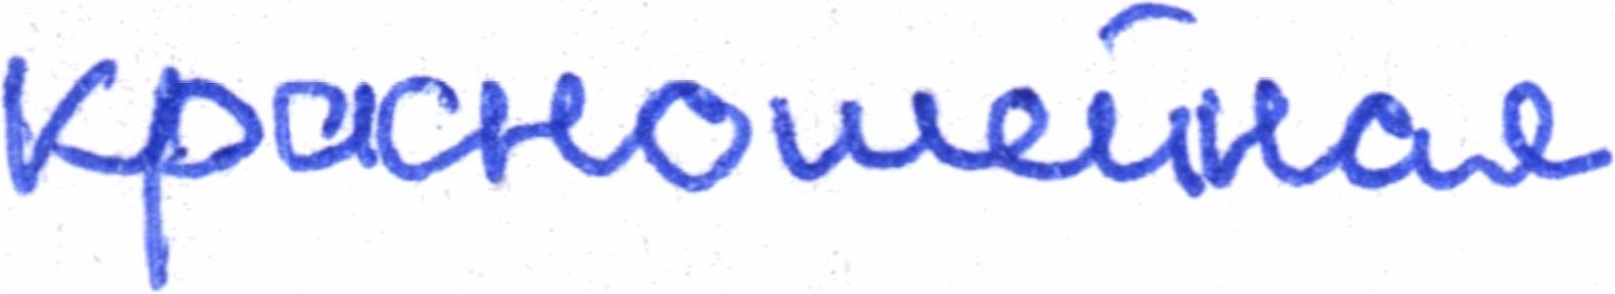красношейная
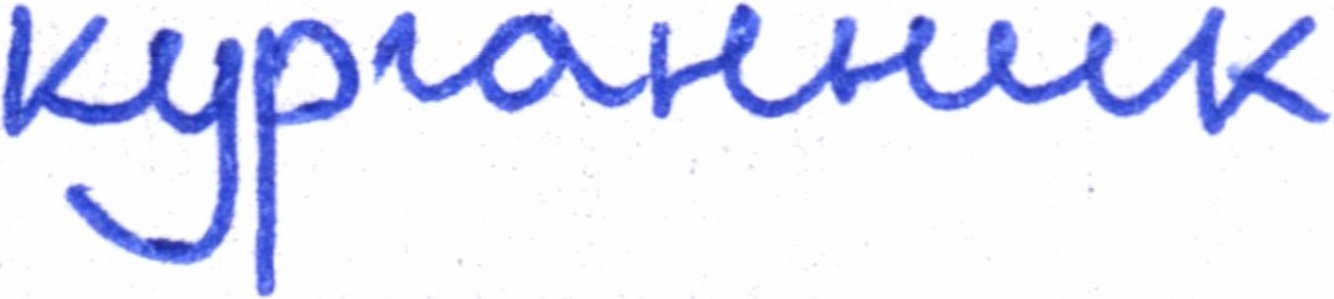курганник
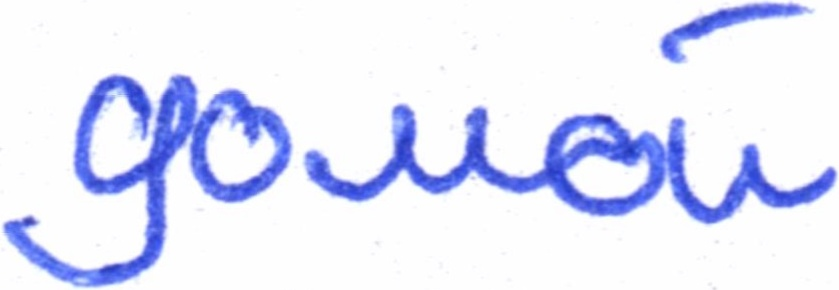домой
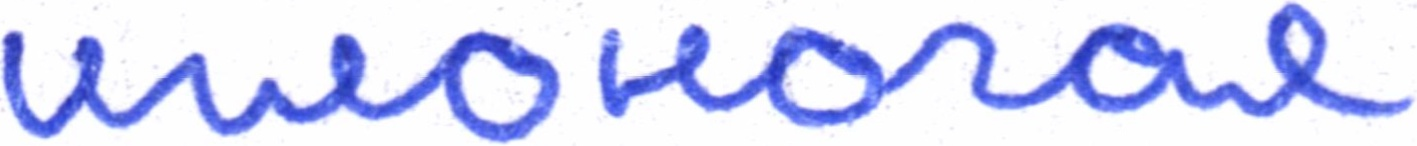иглоногая
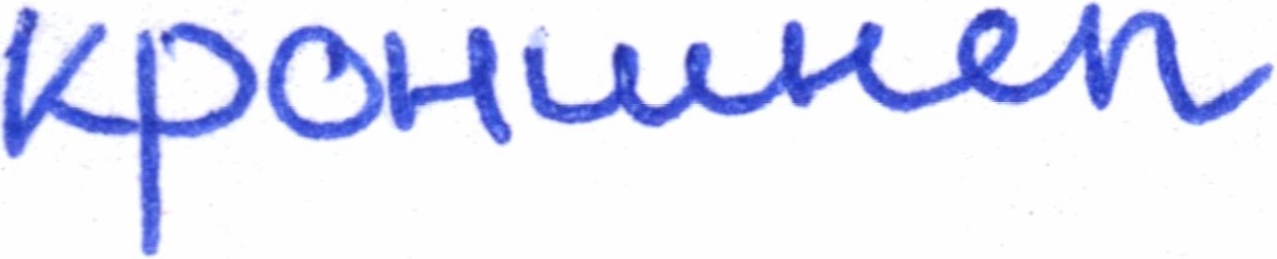кроншнеп
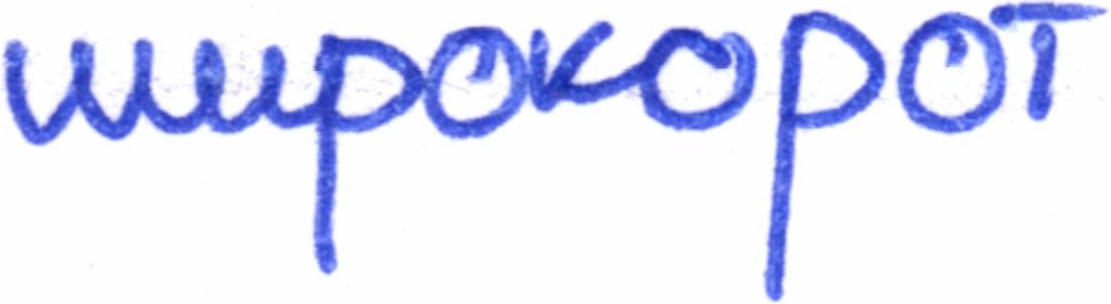широкорот
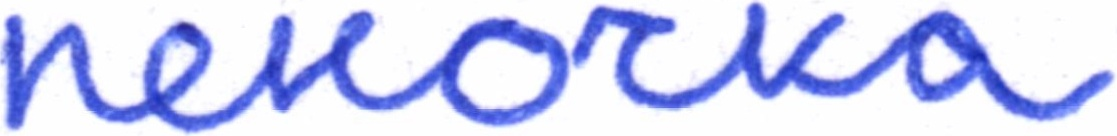пеночка
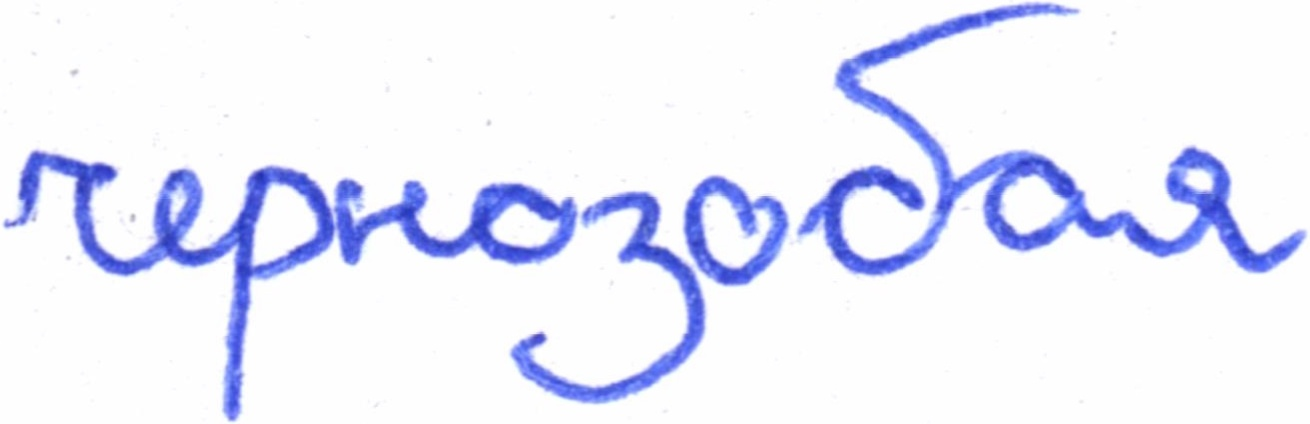чернозобая
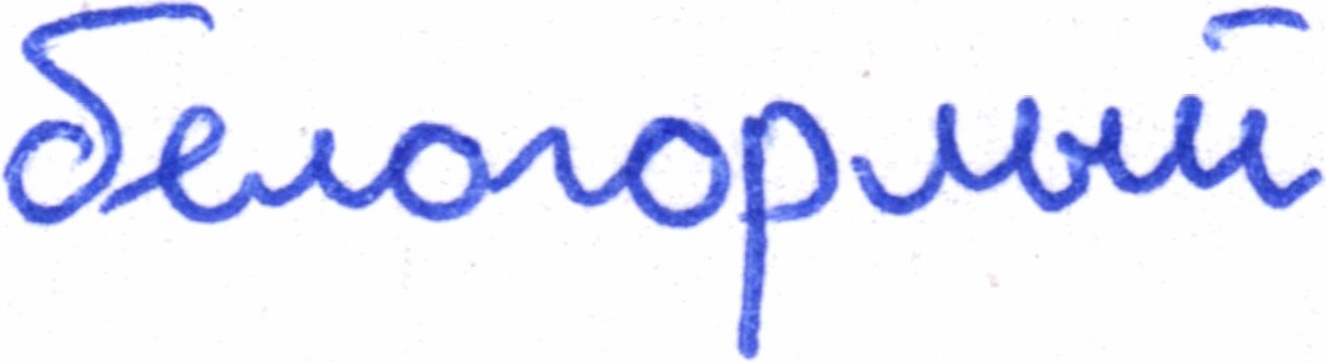белогорлый
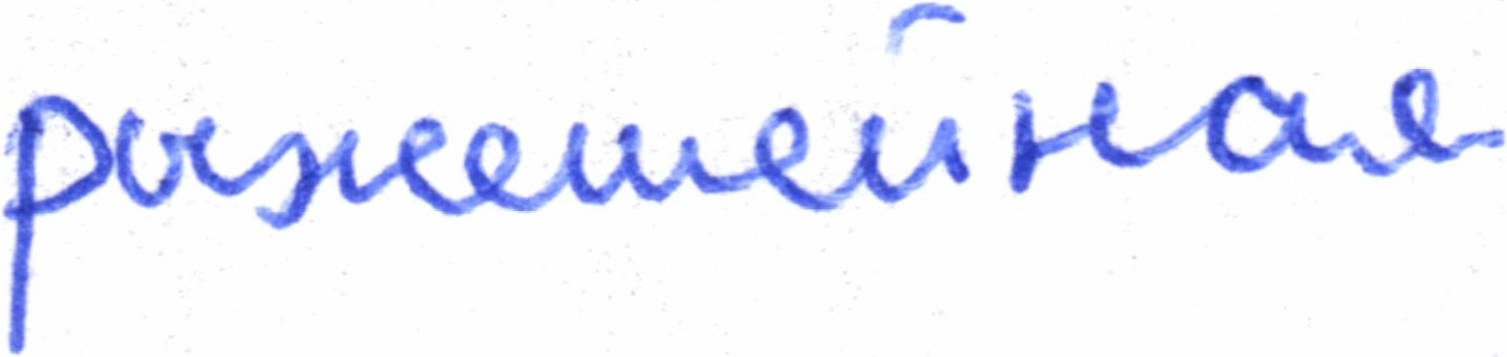рыжешейная
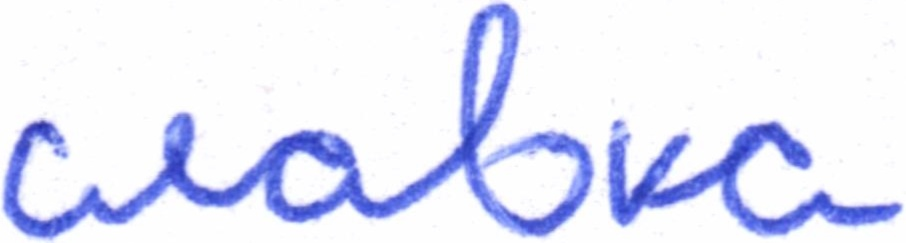славка
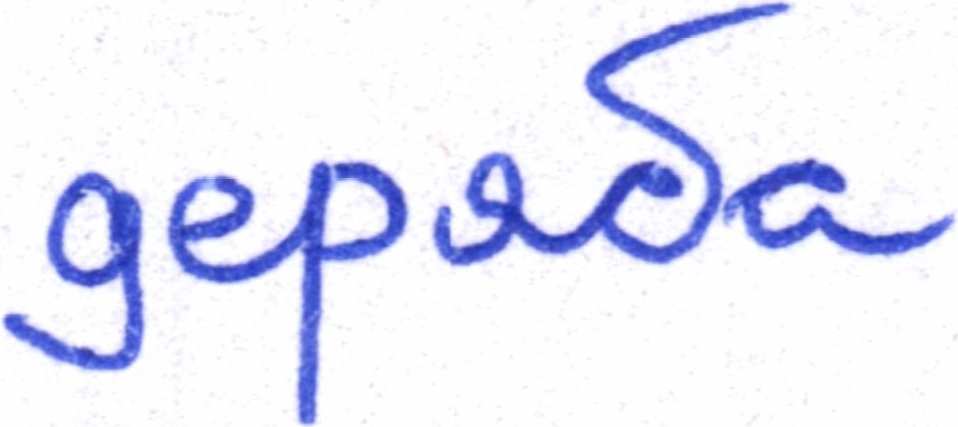деряба
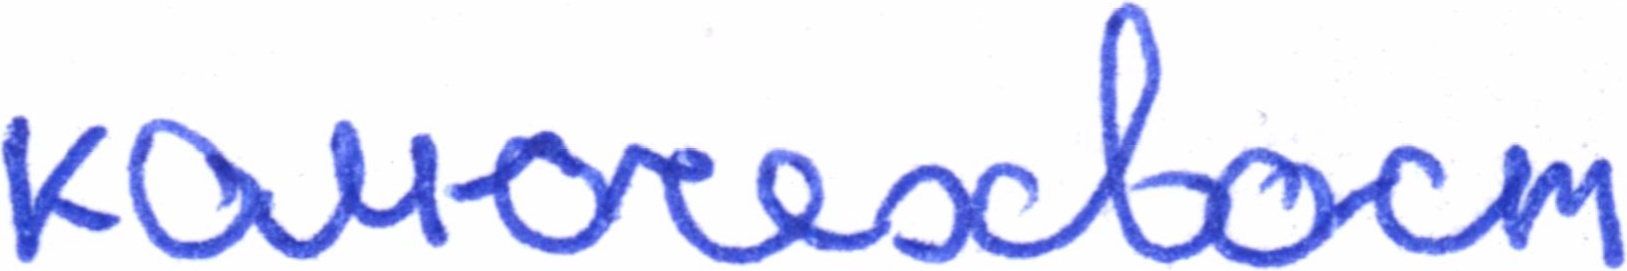колючехвост
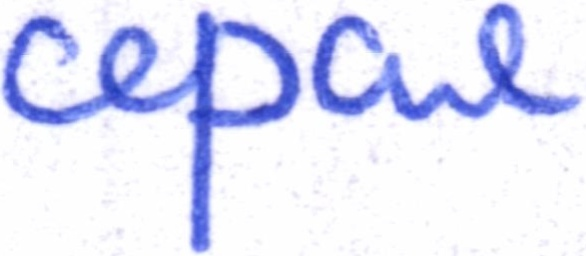серая
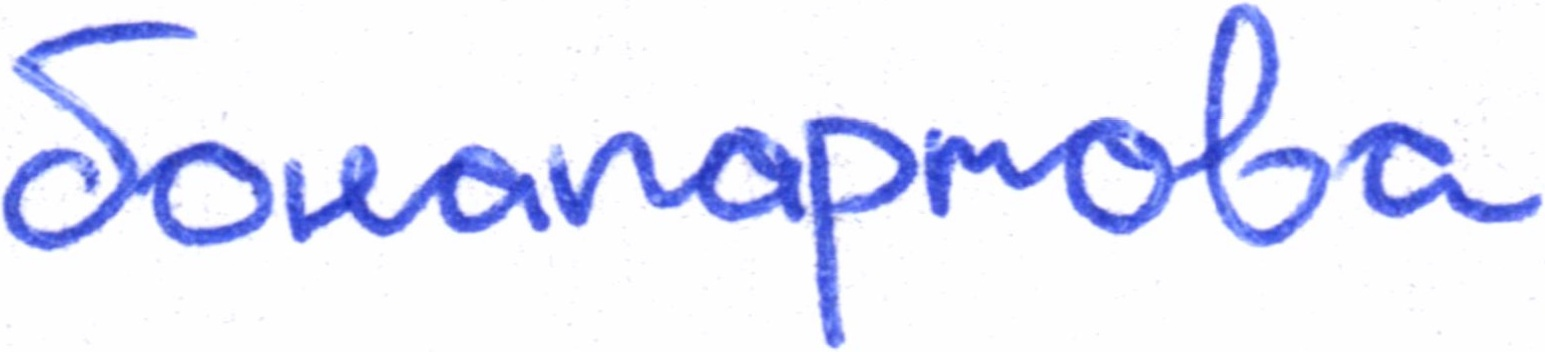бонапартова
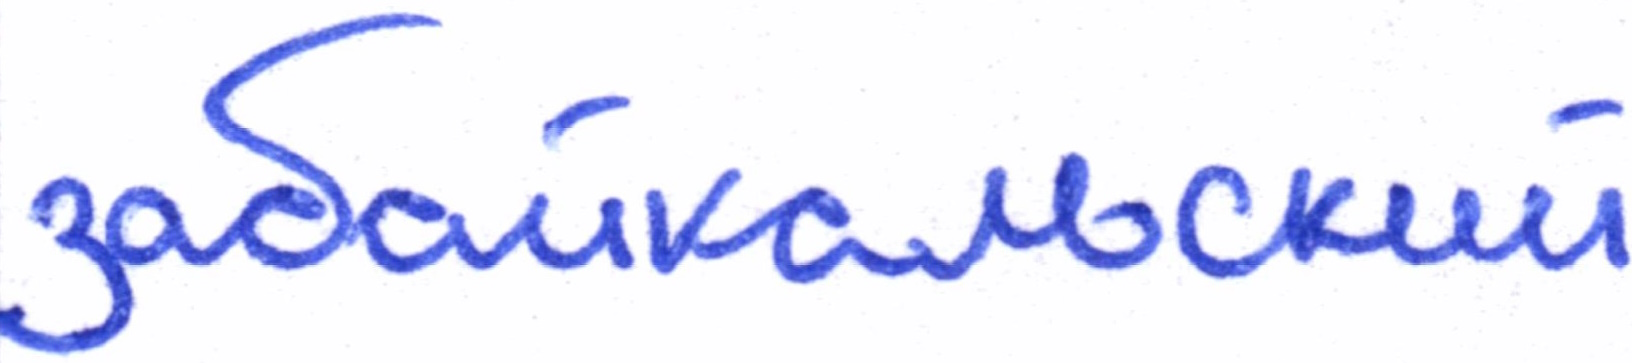забайкальский
